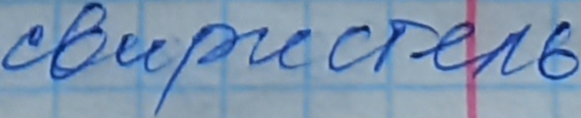свиристель
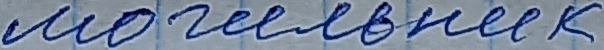могильник
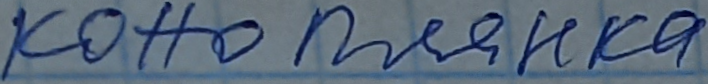коноплянка
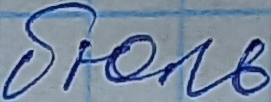бюль
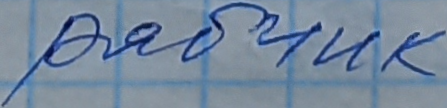рябчик
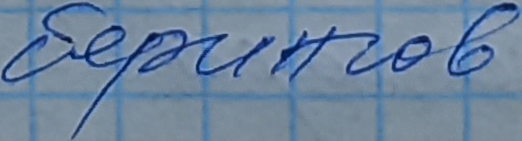берингов
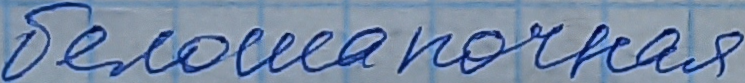белошапочная
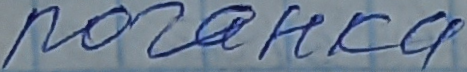поганка
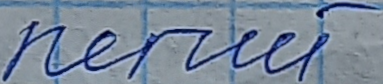пегий
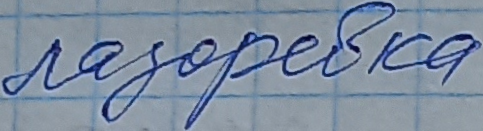лазоревка
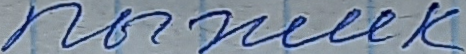пыжик
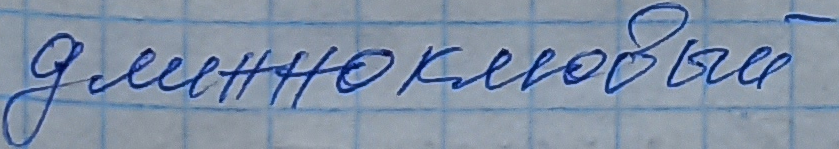длинноклювый
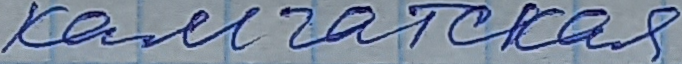камчатская
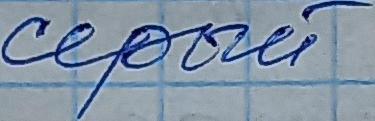серый
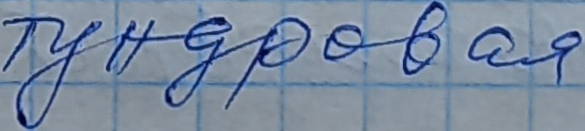тундровая
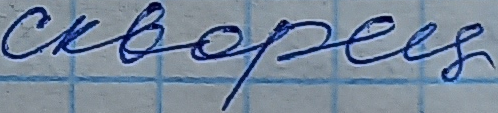скворец
